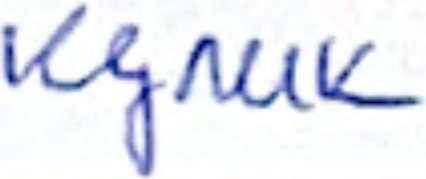кулик
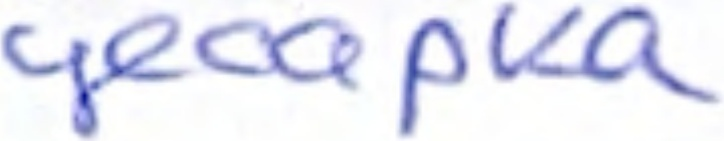цесарка
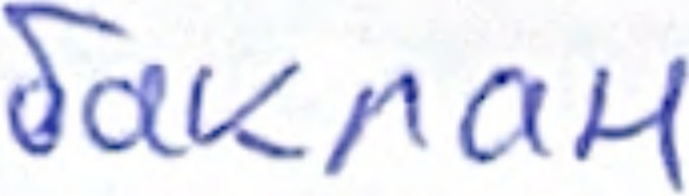баклан
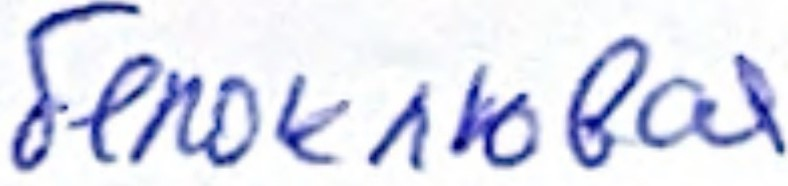белоклювая
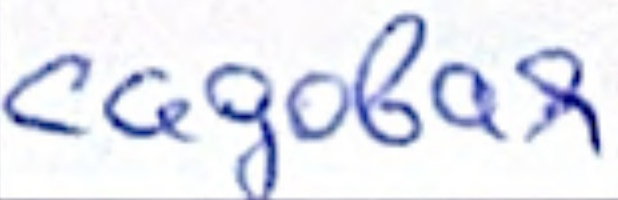садовая
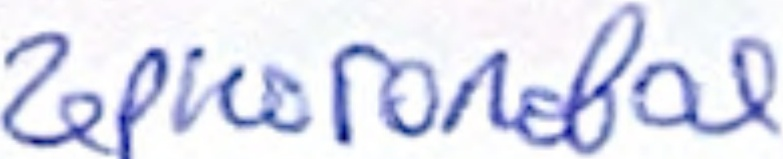черноголовая
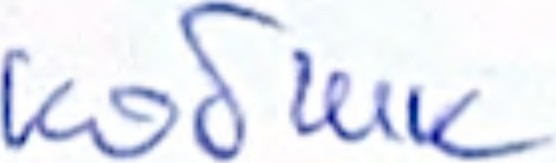кобчик
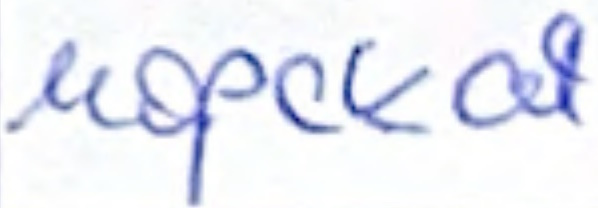морская
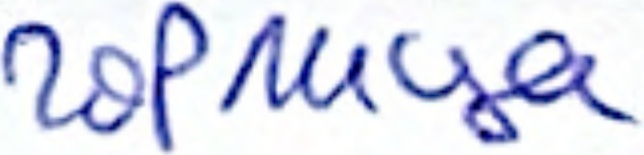горлица
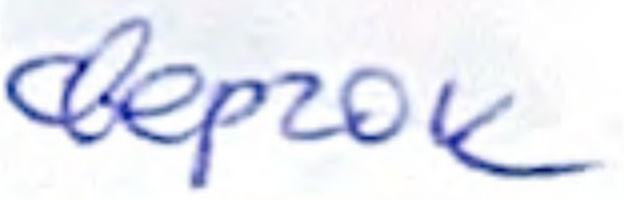сверчок
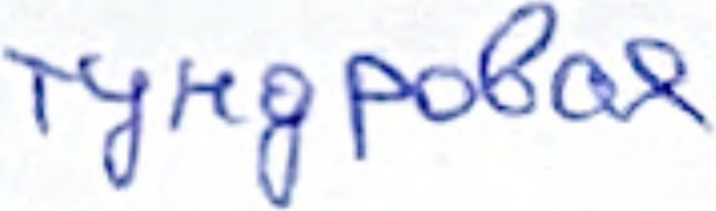тундровая
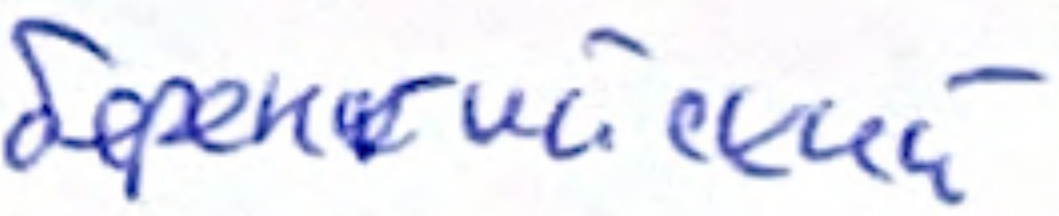беренгийский
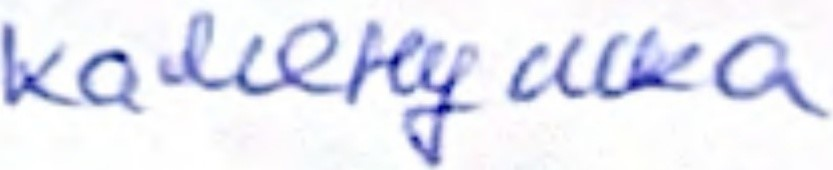каменушка
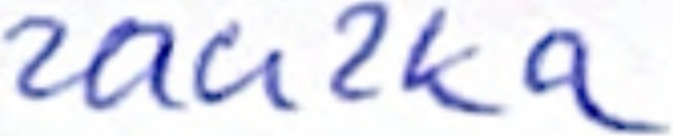гаичка
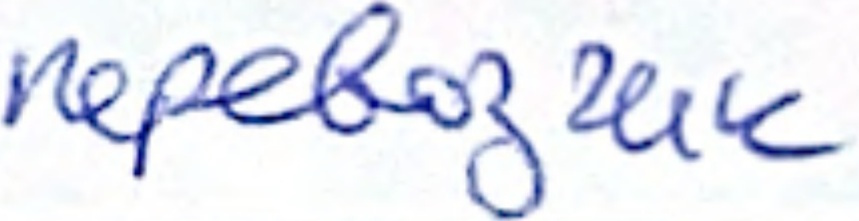перевозчик
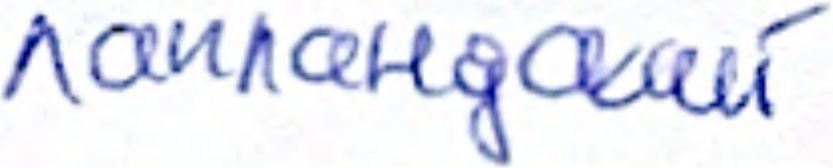лапландский
